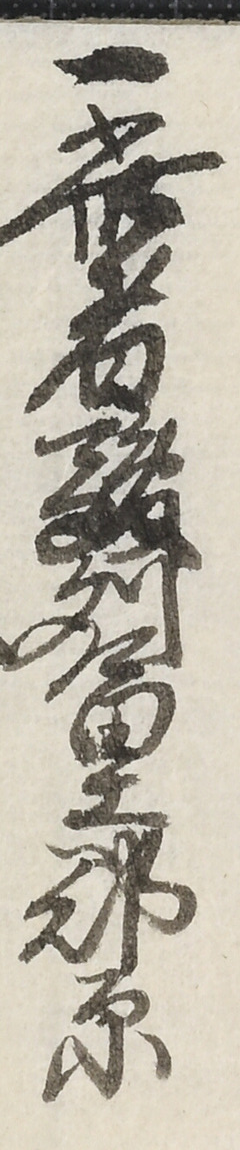一此者駿州富士郡原
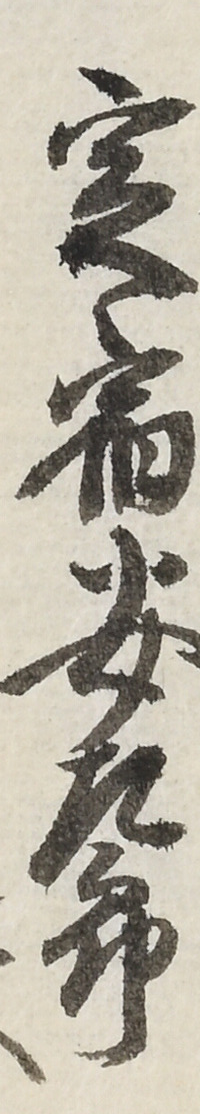定宿安太郎
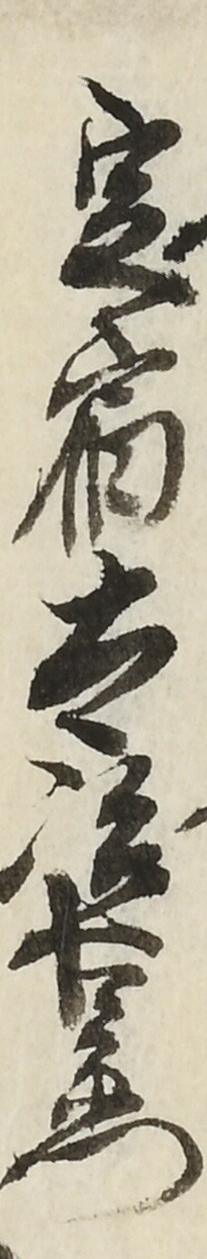定宿太治右衛門
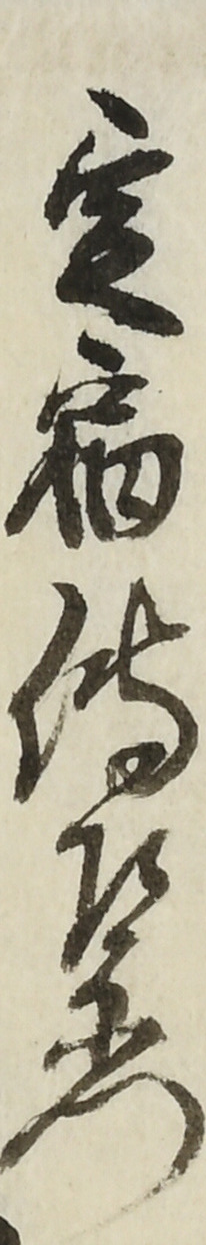常宿伝左衛門

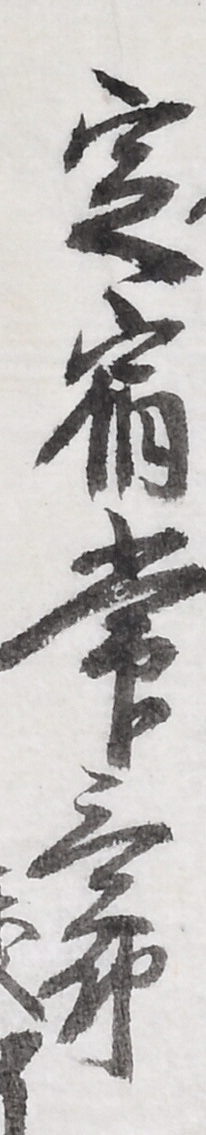定宿常三郎
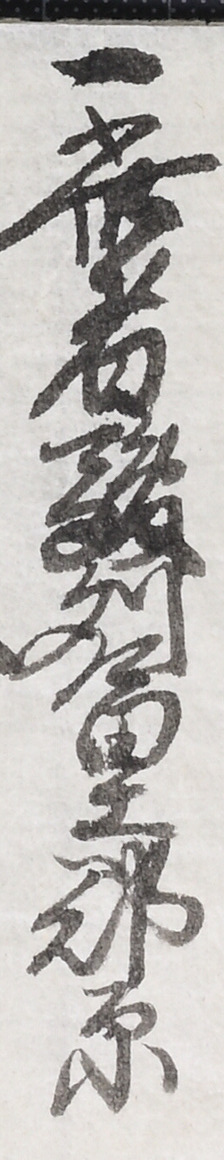一此者駿州富士郡原
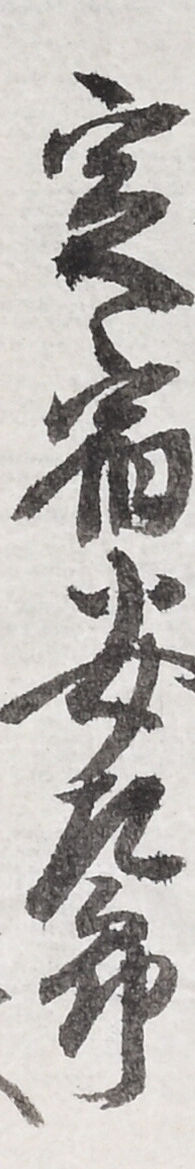定宿安太郎
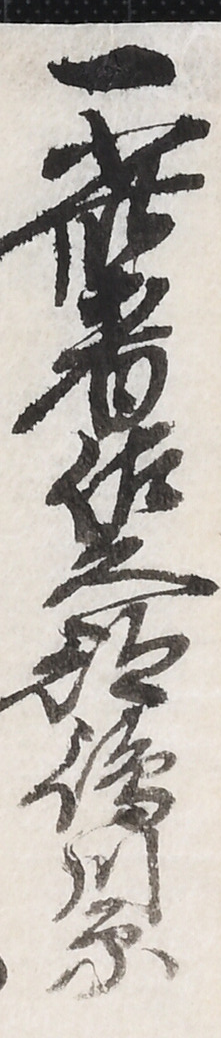一此者佐久郡島川原
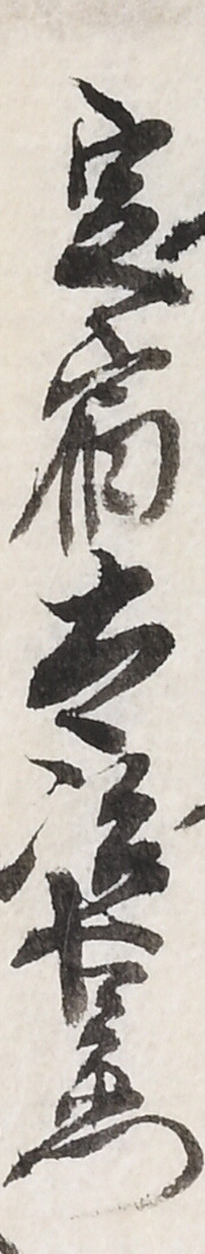定宿太治右衛門
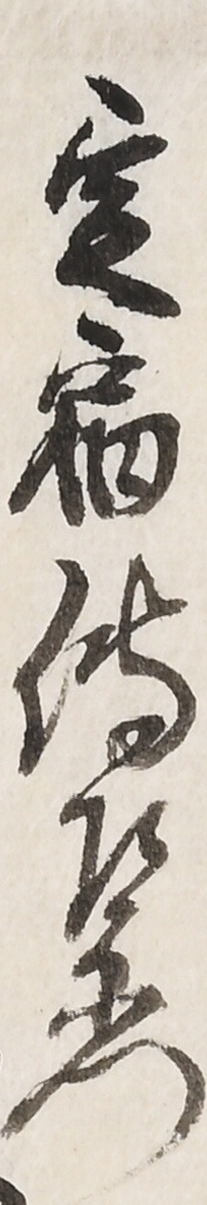常宿伝左衛門
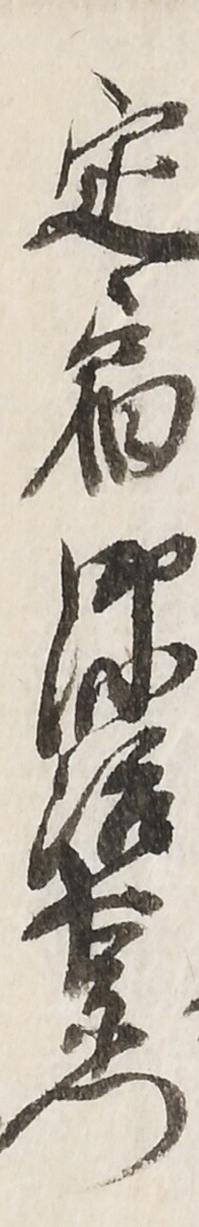定宿源治右衛門
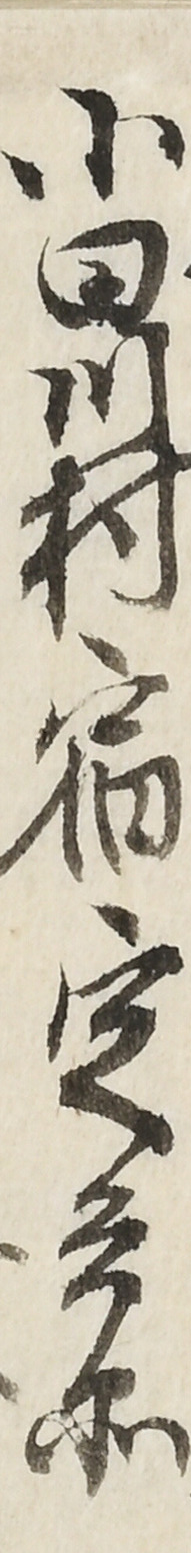小田川村宿定兵衛

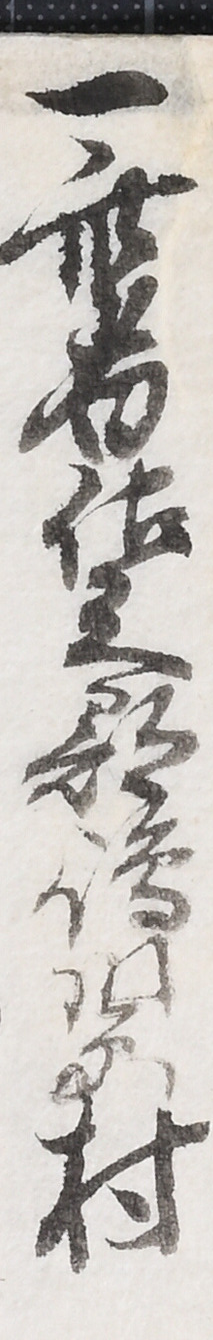一此者佐久郡島河原村
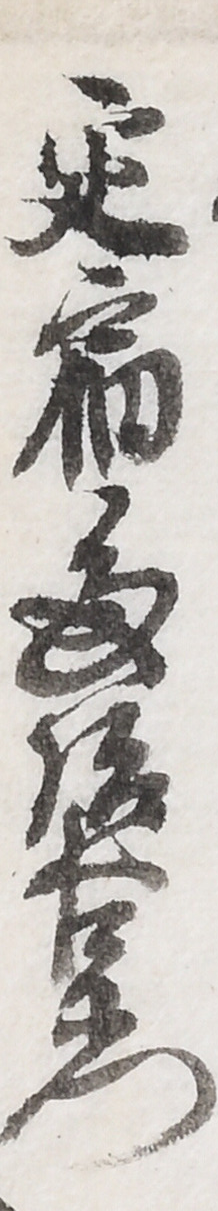定宿多治右衛門
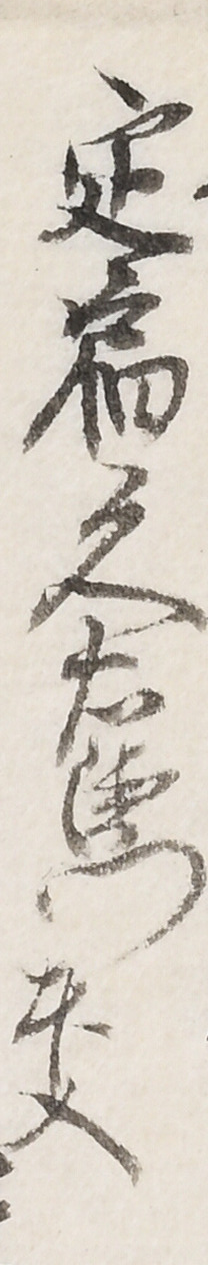常宿久右衛門
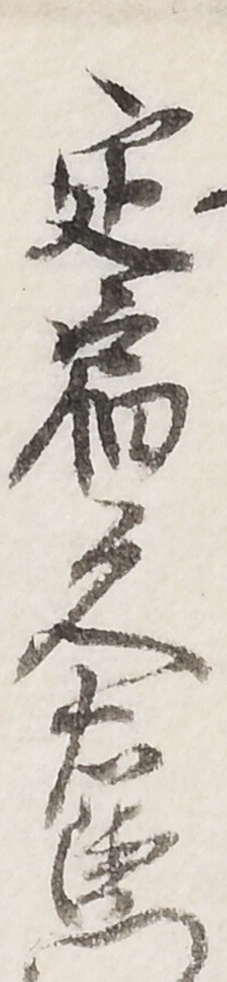常宿久右衛門
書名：安政七庚申年正月他国石切名前書上帳
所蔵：伊那市立高遠町図書館・合同会社AMANE
